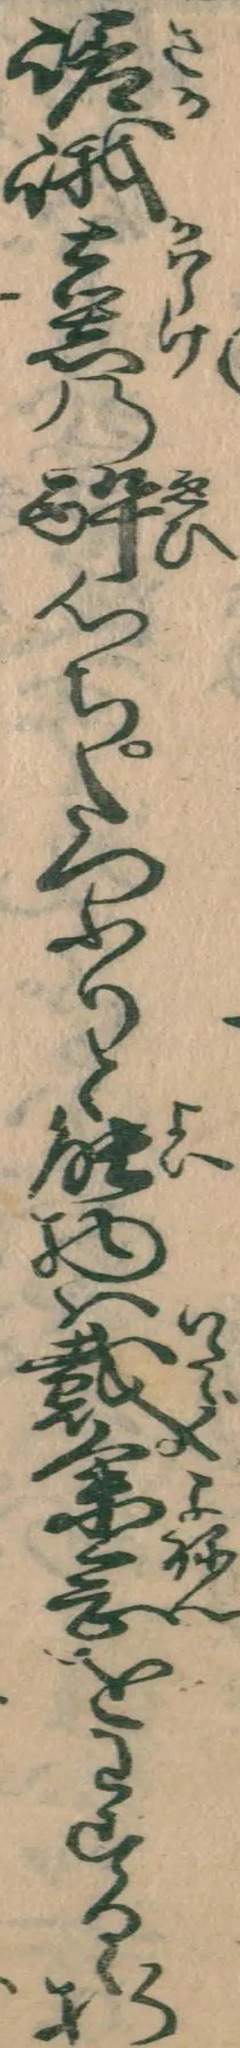嵯峨土器の酔心ち。たつふりと能物は戴。余念をわするゝ折
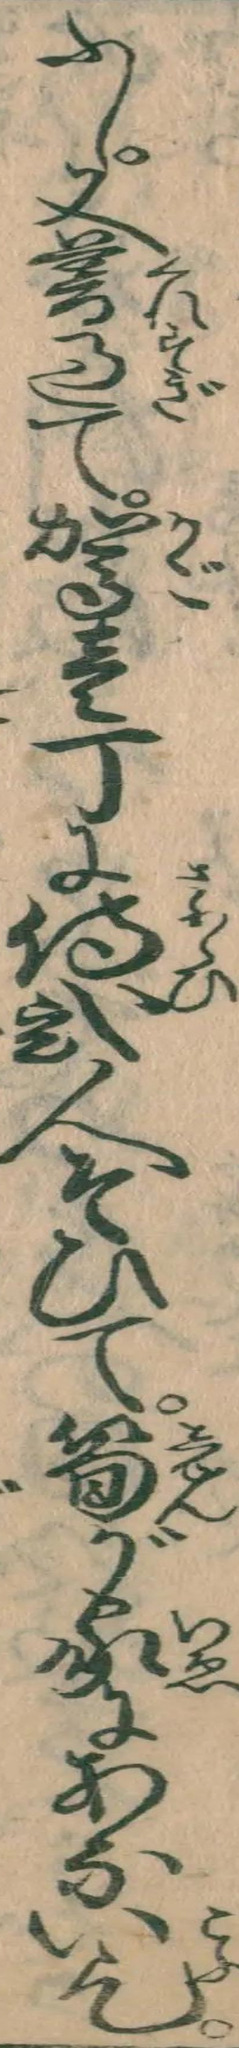ふし。又暮過て。駕壱丁に侍弐人そひて。筍が家にあない乞。
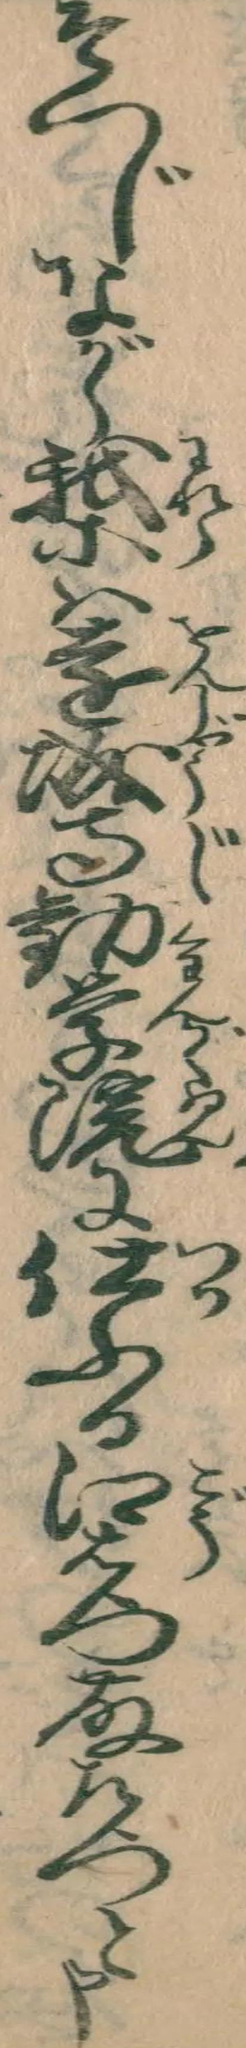そつじながら我等は遠城寺勧学院に仕ふる江右衛門藤左衛門と申
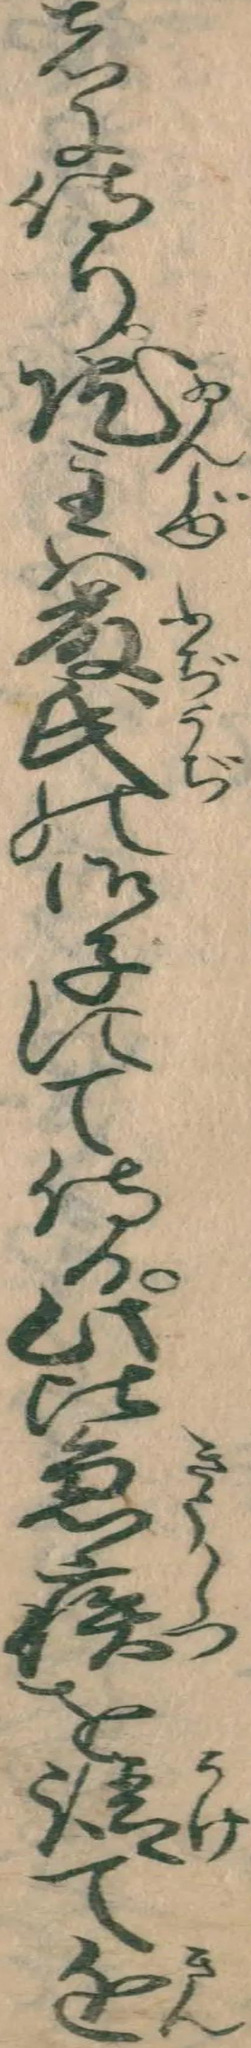者に侍り。院主は藤氏の御子にて侍る。此比急疾を請て近
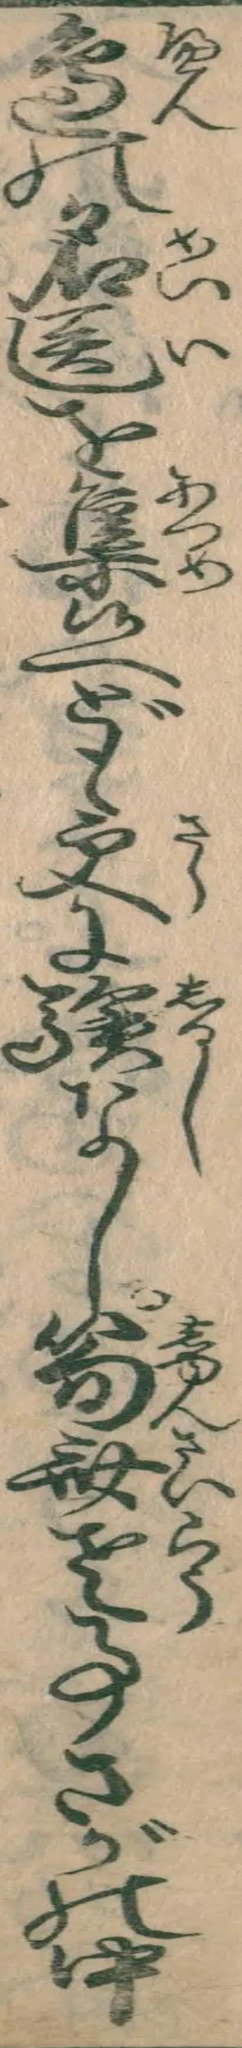辺の名医を集候へども更に験なし。筍斎老事さがの中
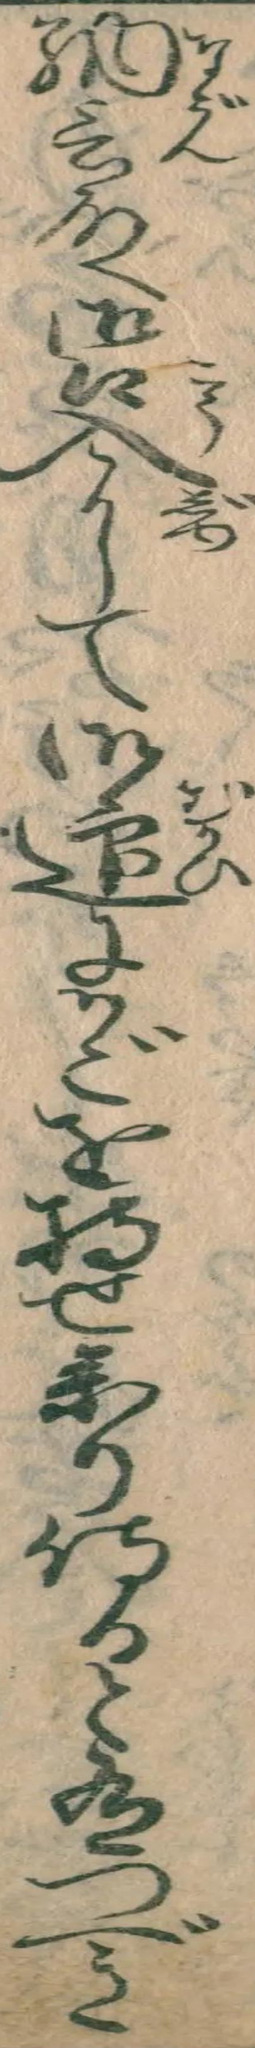納言殿御口入にて御迎にかごを持せ参り侍ると有つべき
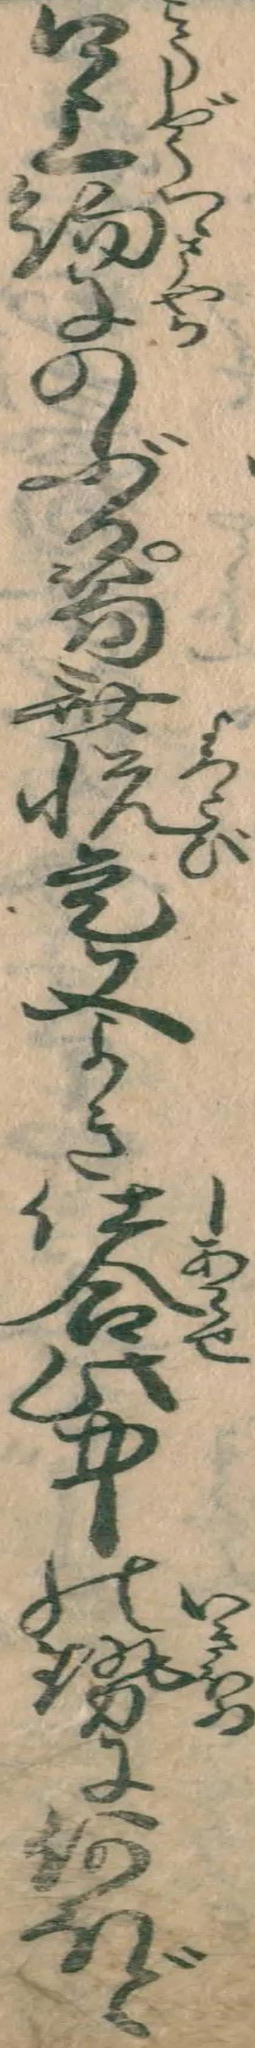口上約にのぶる。筍斎悦是又よき仕合此中の勢に何ほど
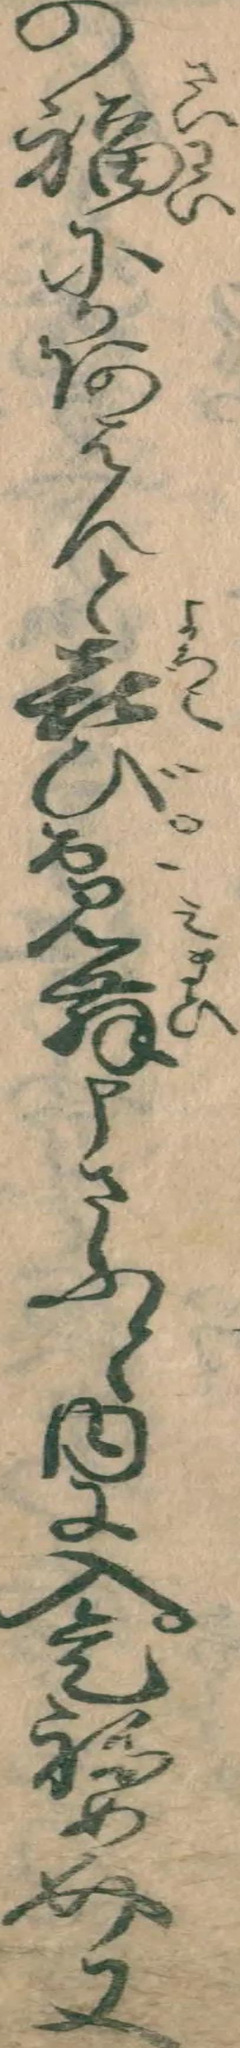の福にかあはんと喜び。お見舞申さふと内に入。是ねめ介又
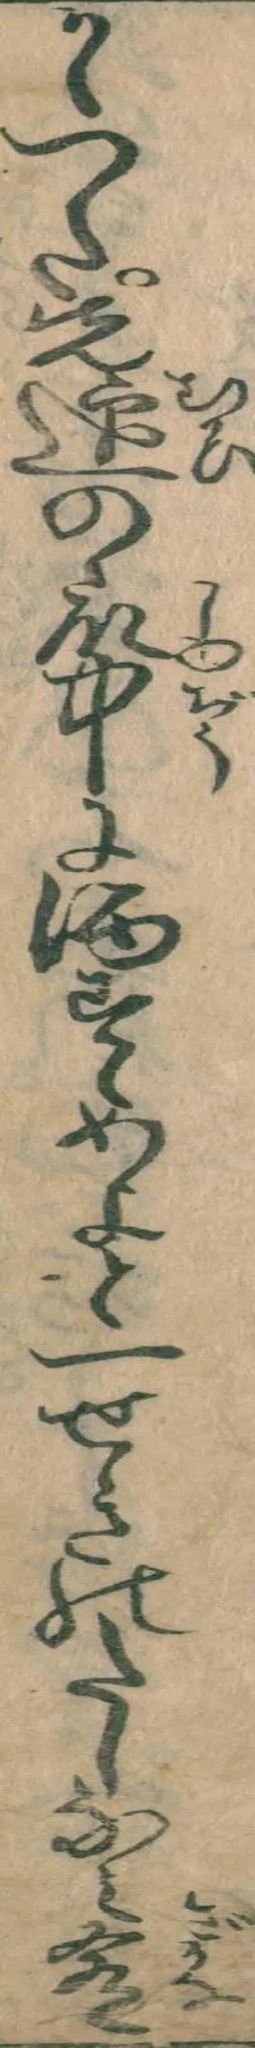かゝつた。先迎の衆中に酒すゝめよと一せきのたしなみ肴

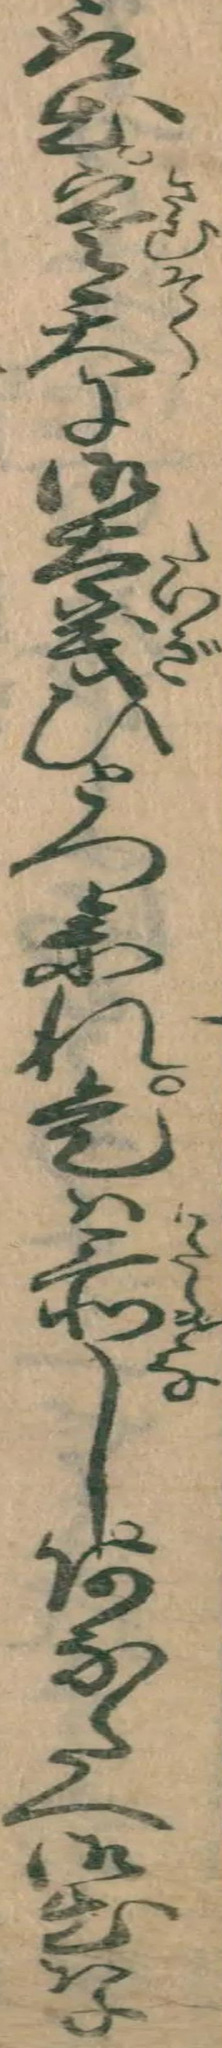取出。寒天に御太義ひとつ参れ。是は忝し。あなたへ御出な
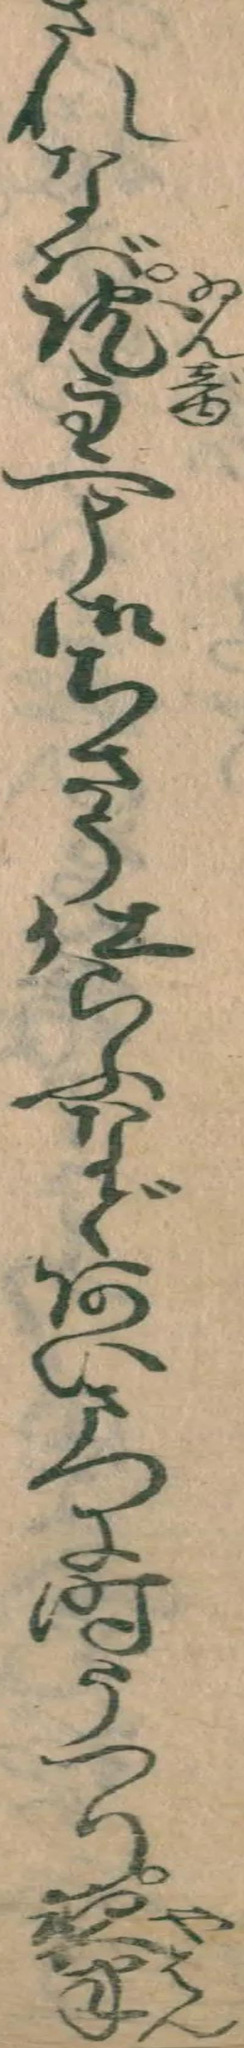されなば。院主へ申御ちさう仕らふなどあいさつに時うつり。夜半
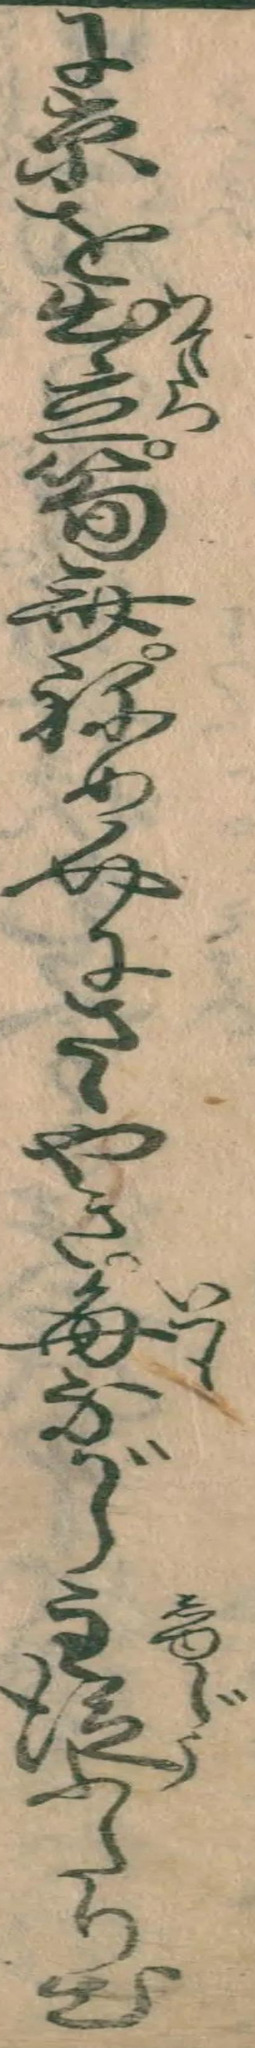に京を出立。筍斎。ねめ介にさゝやき。毎ながら主従ふたり出
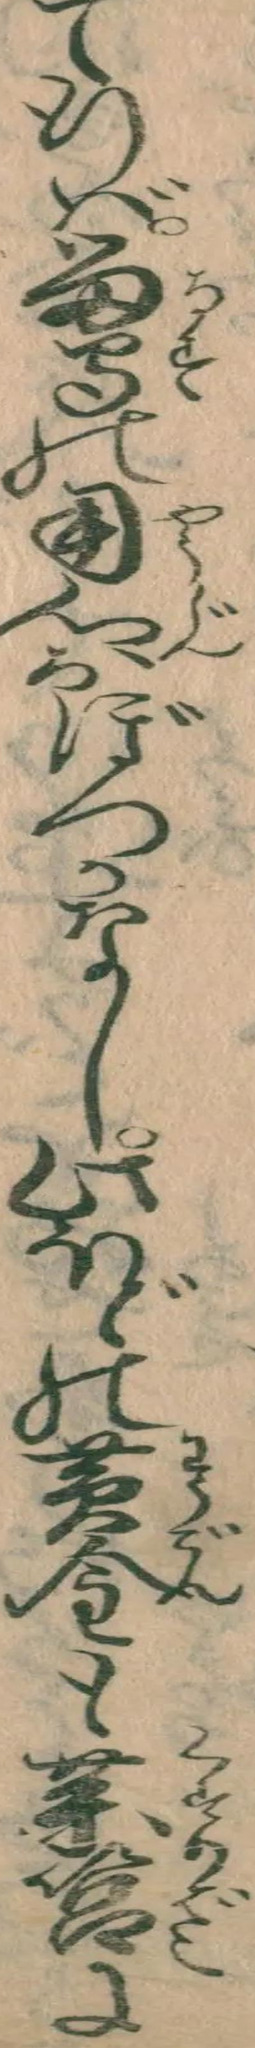て行ば。留守の用心おぼつかなし。此ほどの黄金も薬筥に
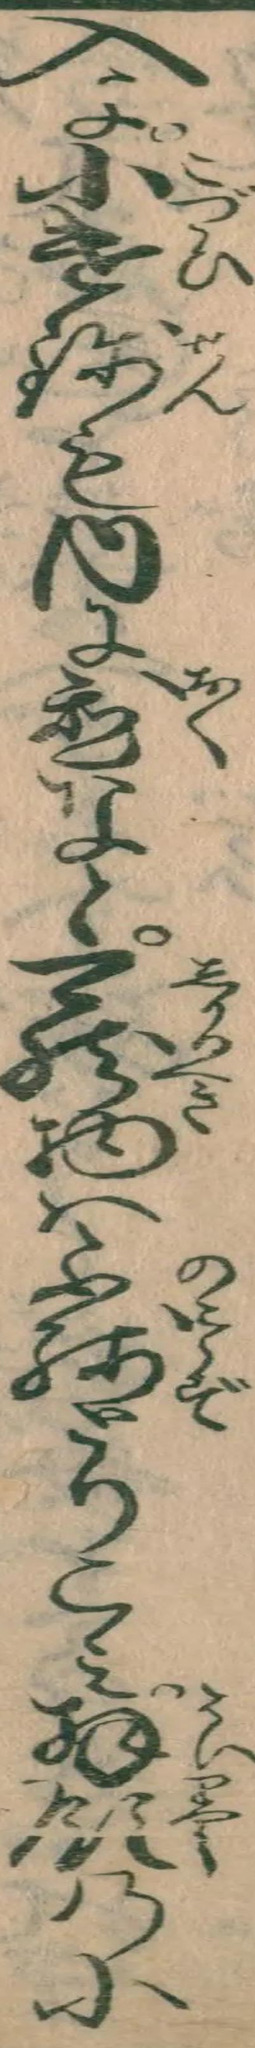入よ。小遣銭も内に置なと。可然物は不残とりこみ。拝領の小
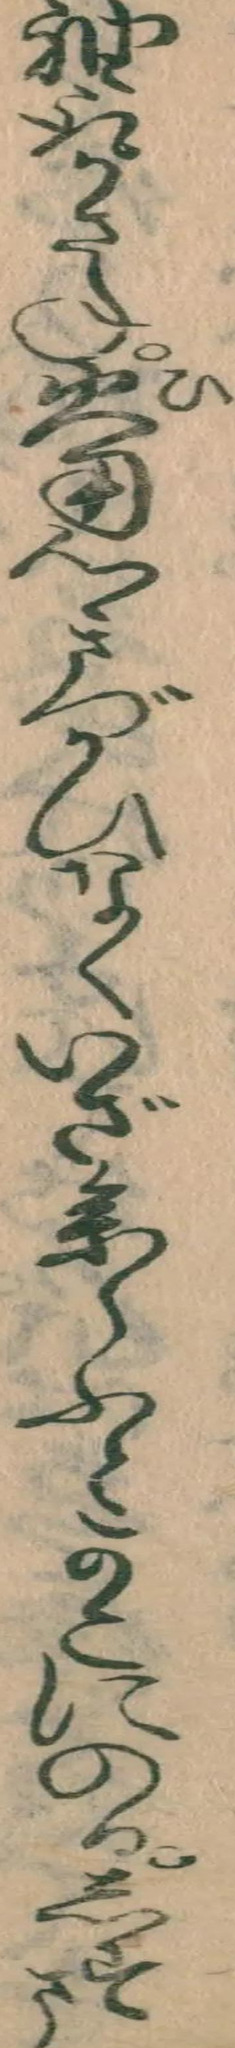袖取かさね。火用心きづかひなくいざ参らふとかこにのる。しすま
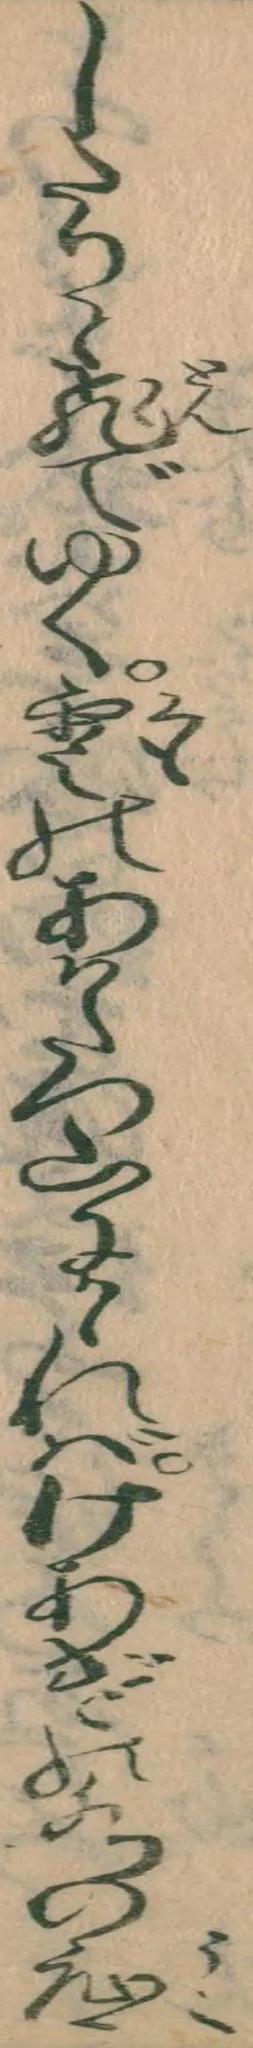したりと飛でゆく。雲のあかたつ山にかゝれば。けあげの水の底
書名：新竹斎 5巻
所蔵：国立国会図書館 National Diet Library, JAPAN
